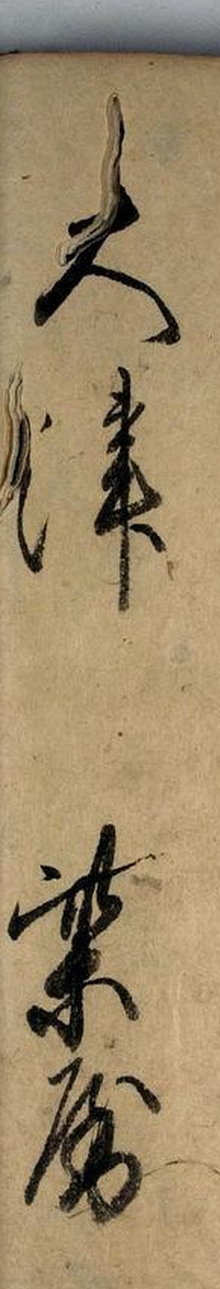大津乗屋
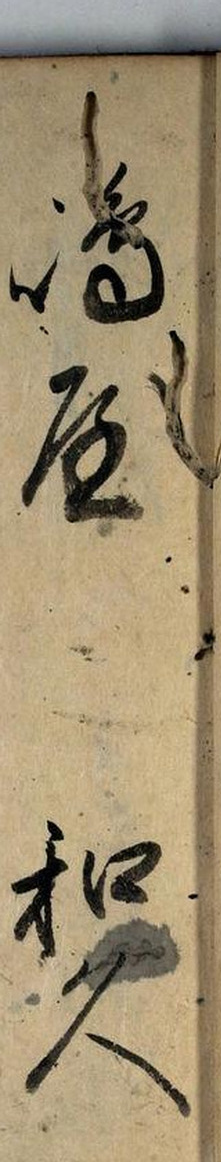嶋屋和久
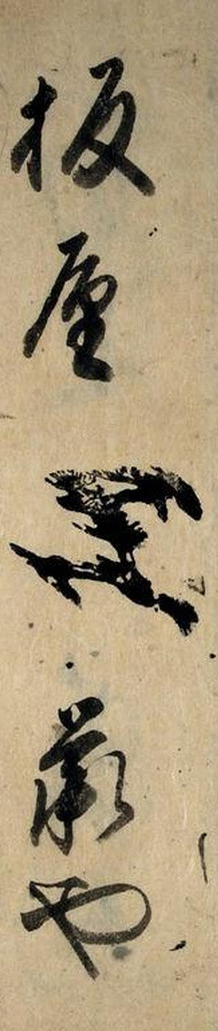板屋承や
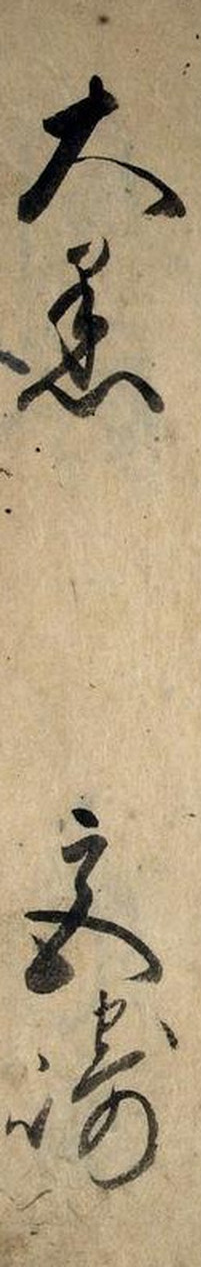大黒宮崎

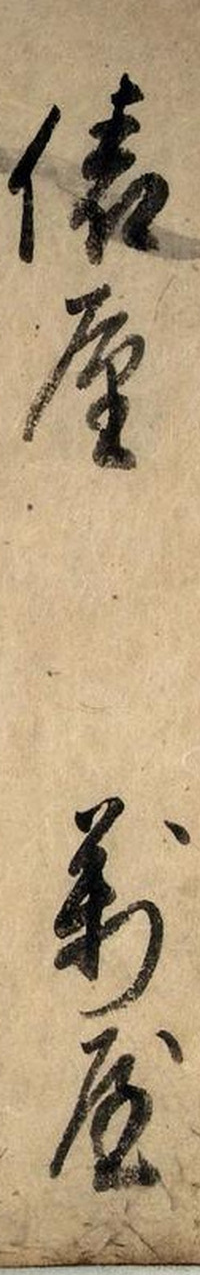俵屋万屋
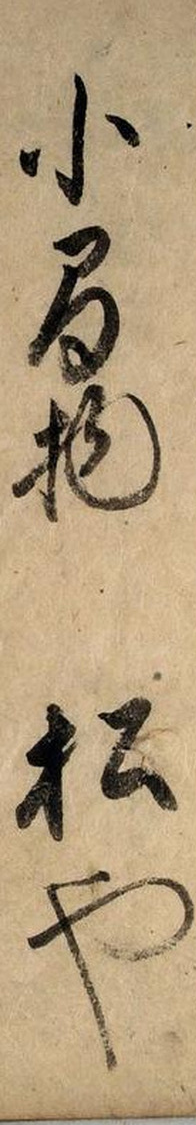小間物松や
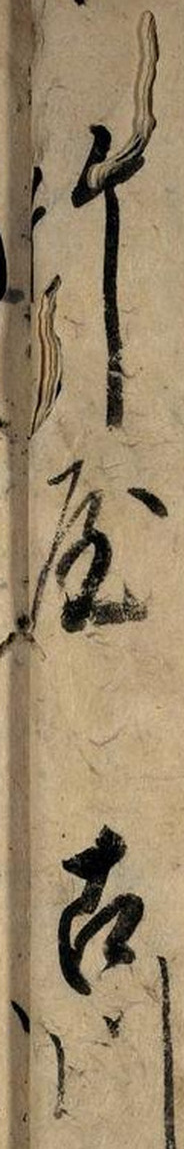竹屋古川
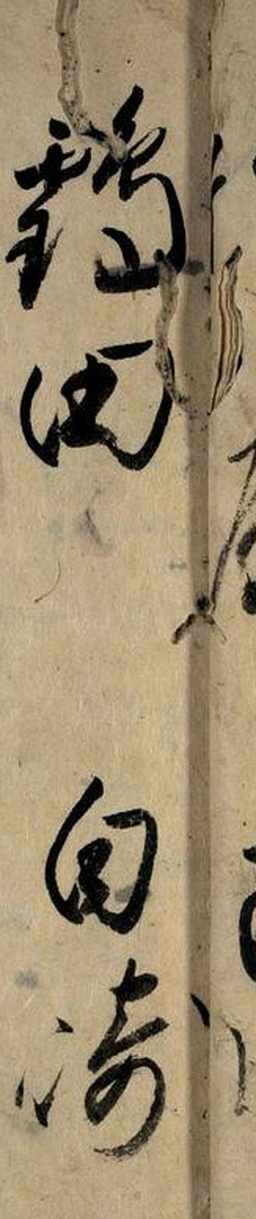鶴田白崎
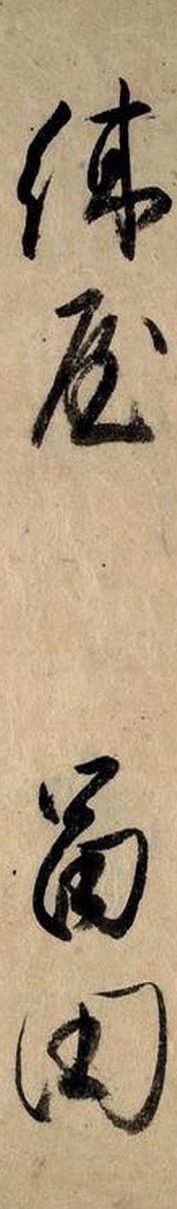徠屋冨田
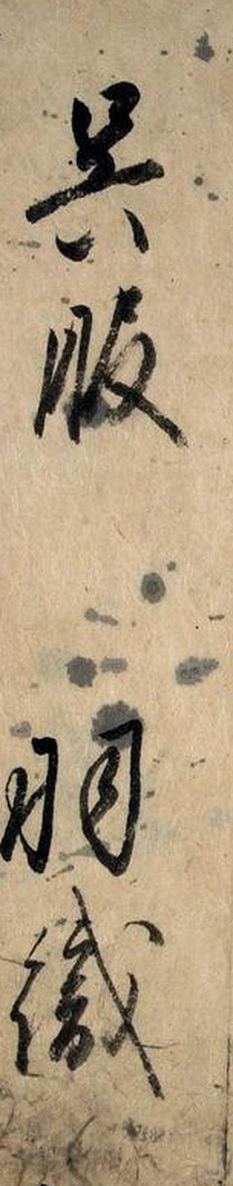呉服羽織

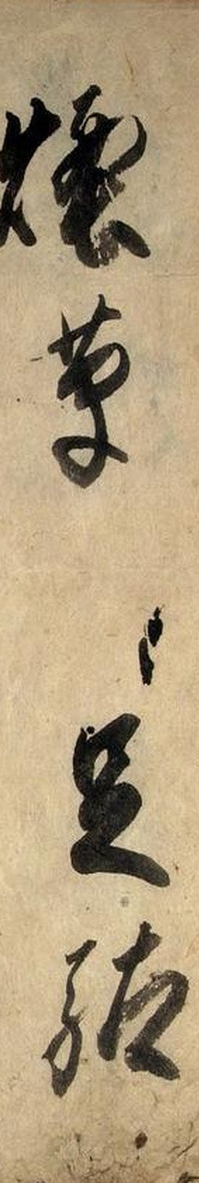煙草足駄
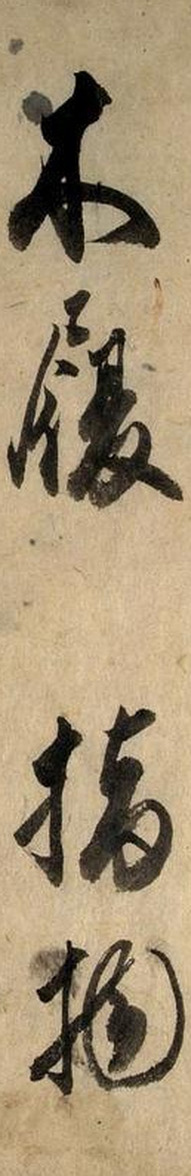木履指物
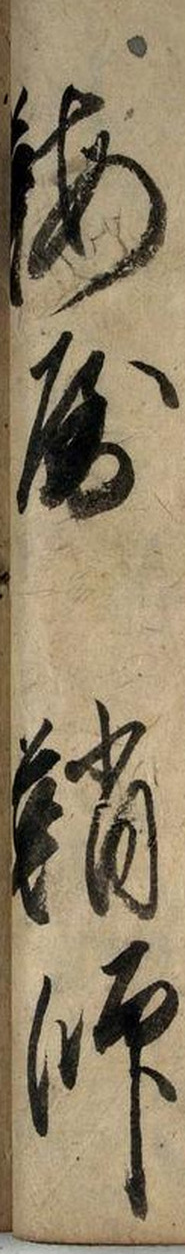鞍屋鞘師
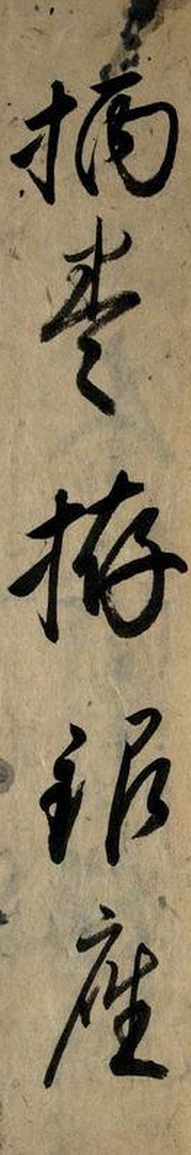柄堂拵銀座
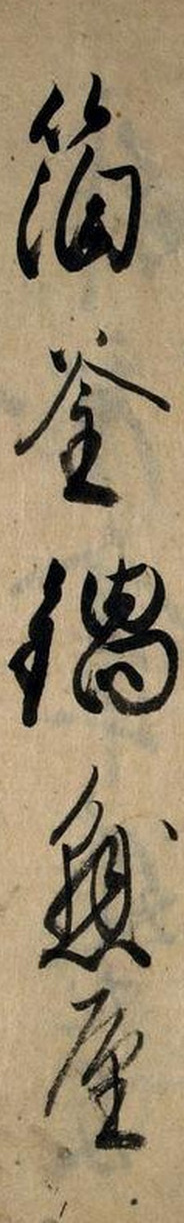箔釜鍋懸屋
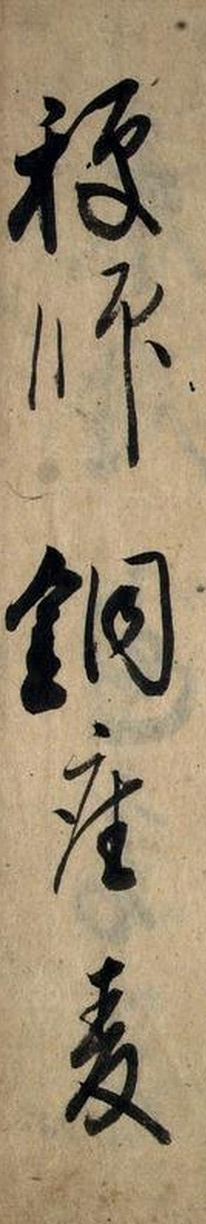禅師銅座麦
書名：御手本（手習、家号之事、小浜商家の屋号）
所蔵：福井県文書館 Fukui Prefectural Archives
